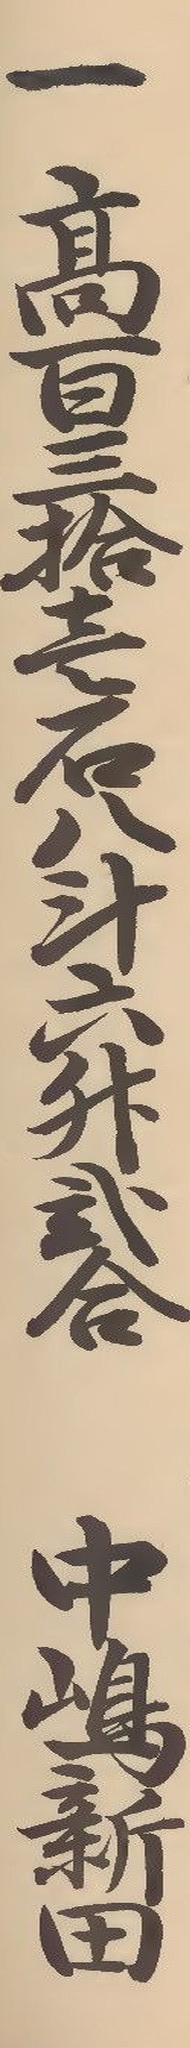一高百三拾壱石八斗六升弐合中島新田
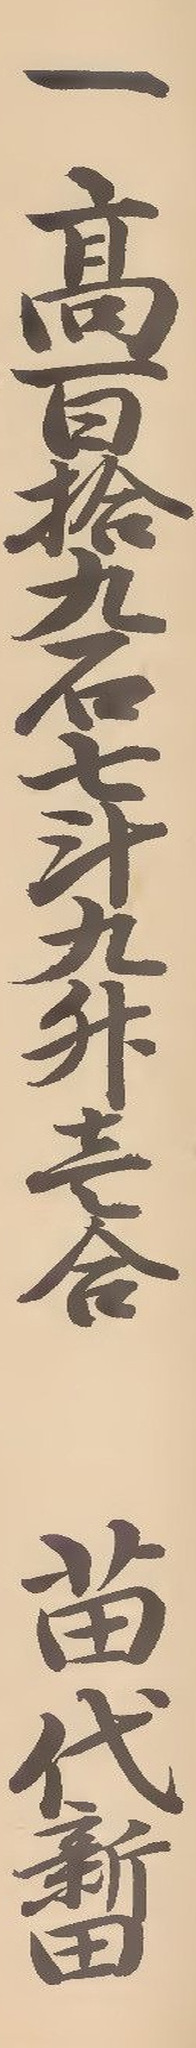一高百拾九石七斗九升壱合苗代新田
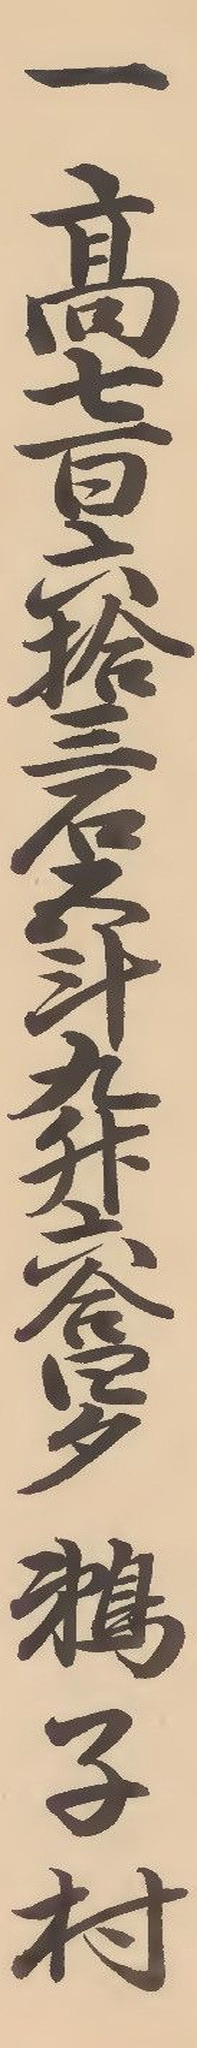一高七百六拾三石五斗九升六合四勺鵜子村
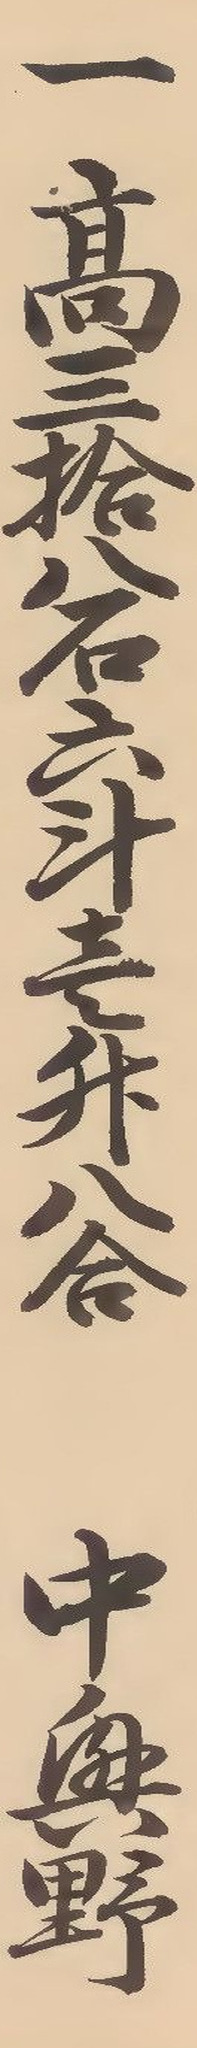一高三拾八石六斗壱升八合中興野
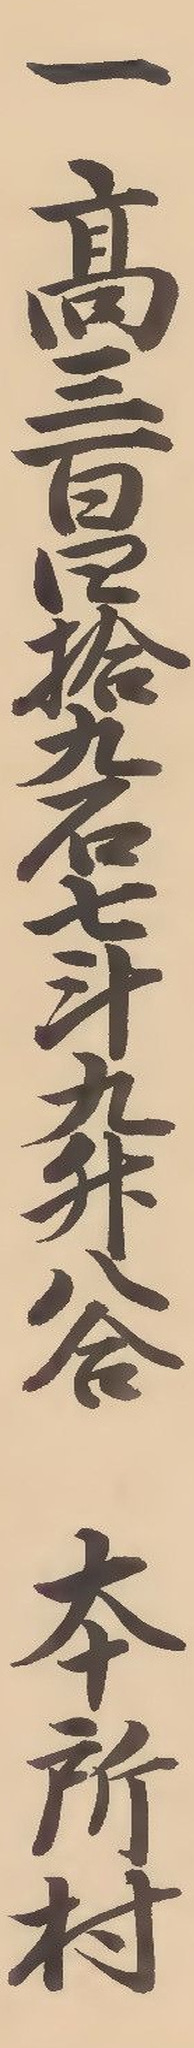一高三百四拾九石七斗九升八合本所村

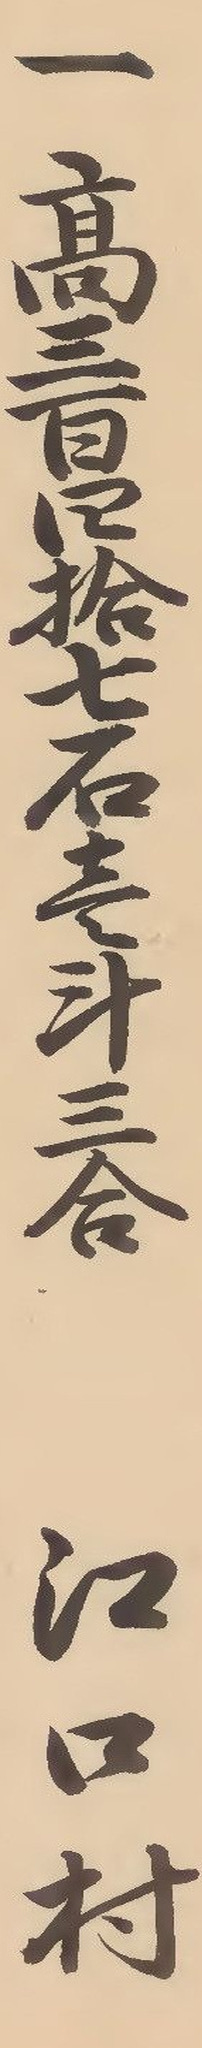一高三百四拾七石壱斗三合江口村
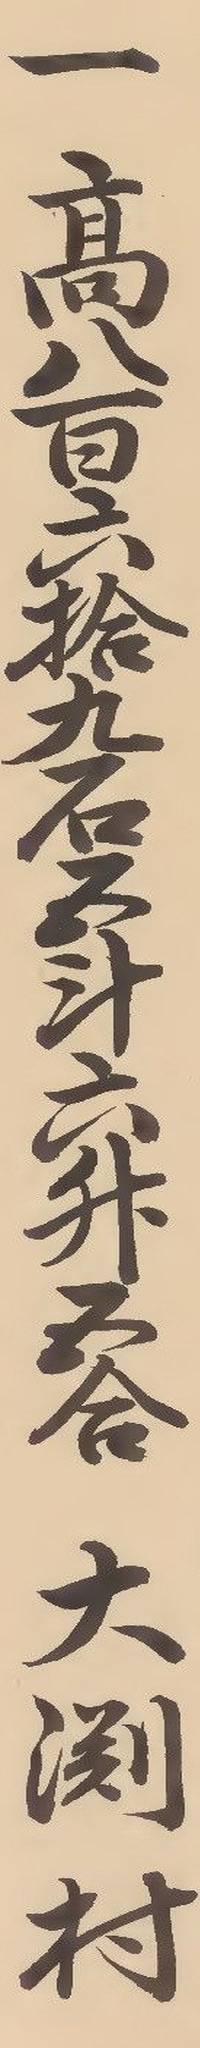一高八百六拾九石五斗六升五合大淵村
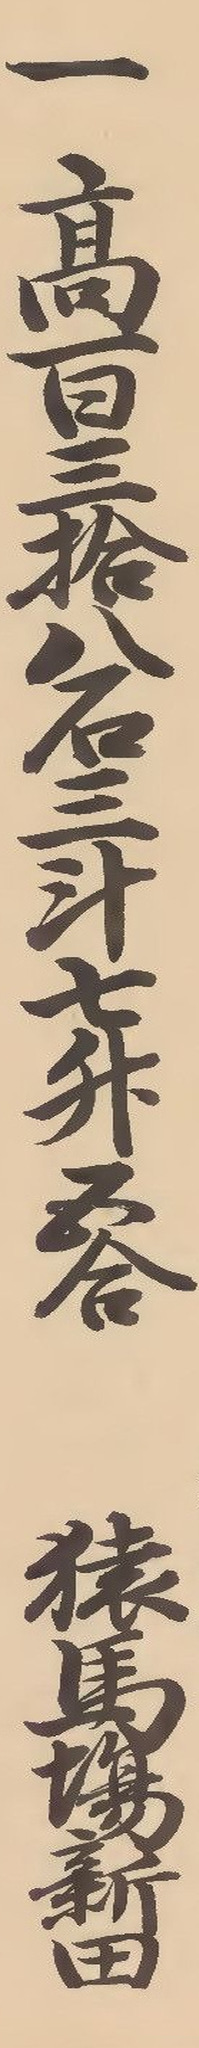一高百三拾八石三斗七升五合猿馬場新田
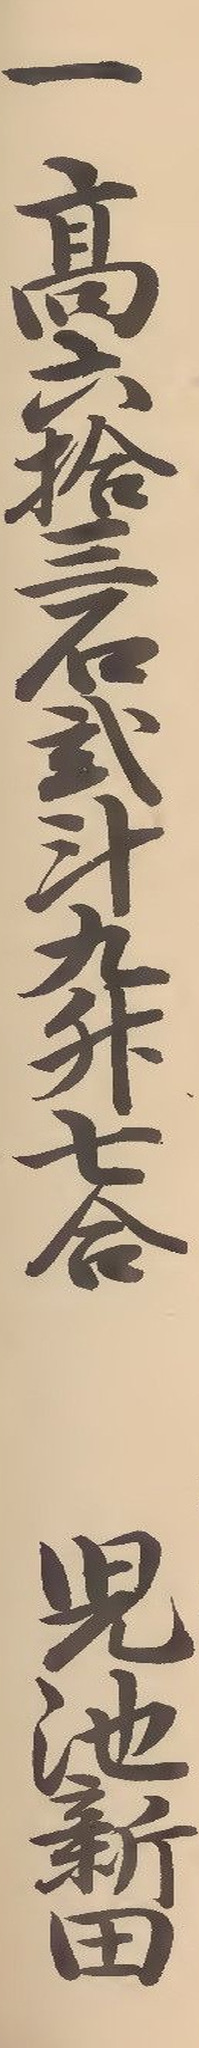一高六拾三石弐斗九升七合児池新田
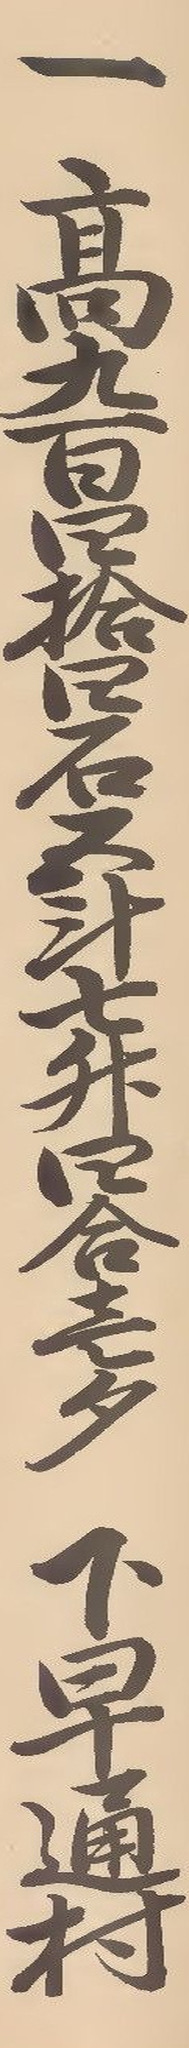一高九百四拾四石五斗七升四合壱勺下早通村
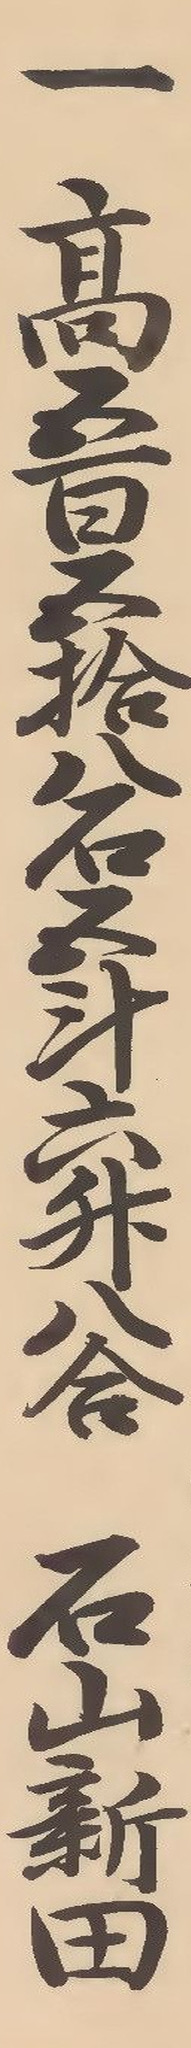一高五百五拾八石五斗六升八合石山新田
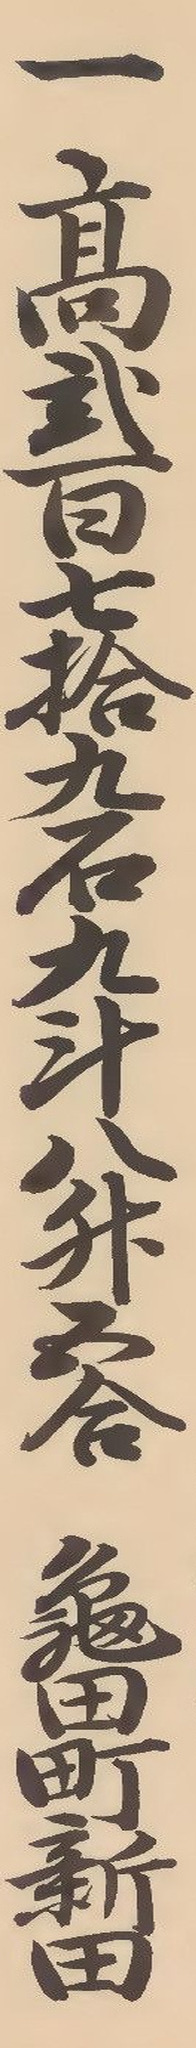一高弐百七拾九石九斗八升五合亀田町新田
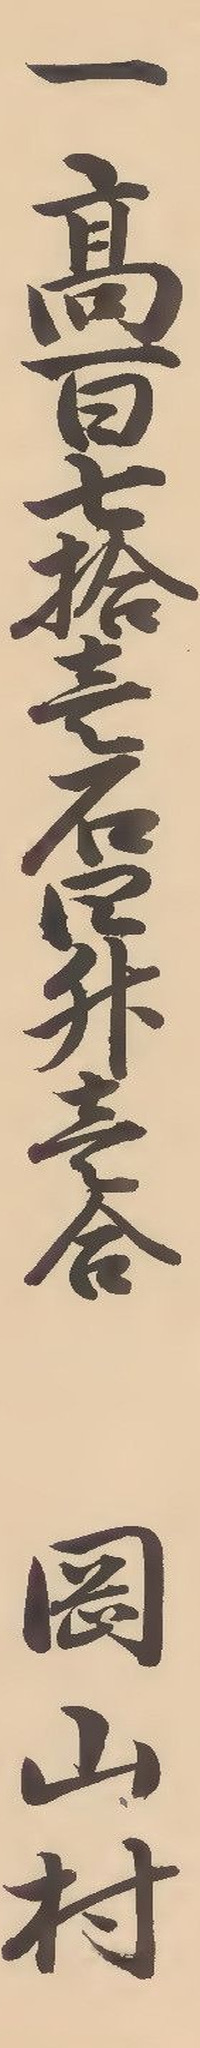一高百七拾壱石四升壱合岡山村

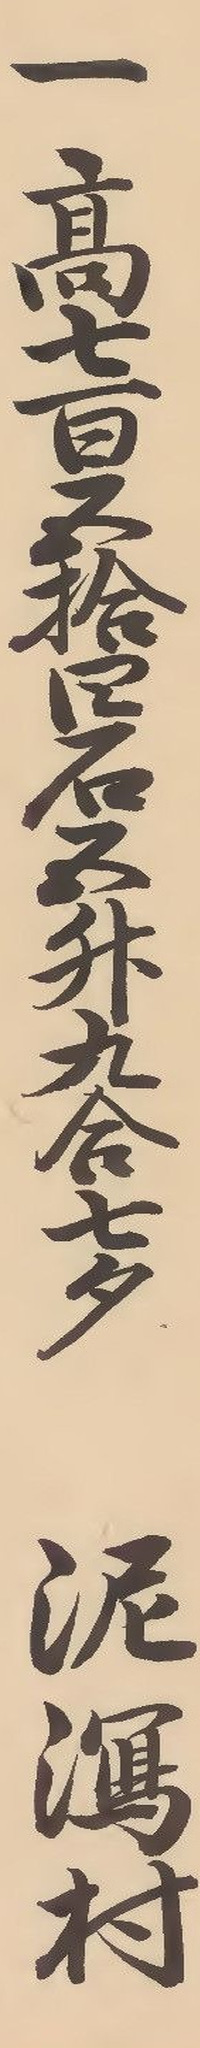一高七百五拾四石五升九合七勺泥潟村
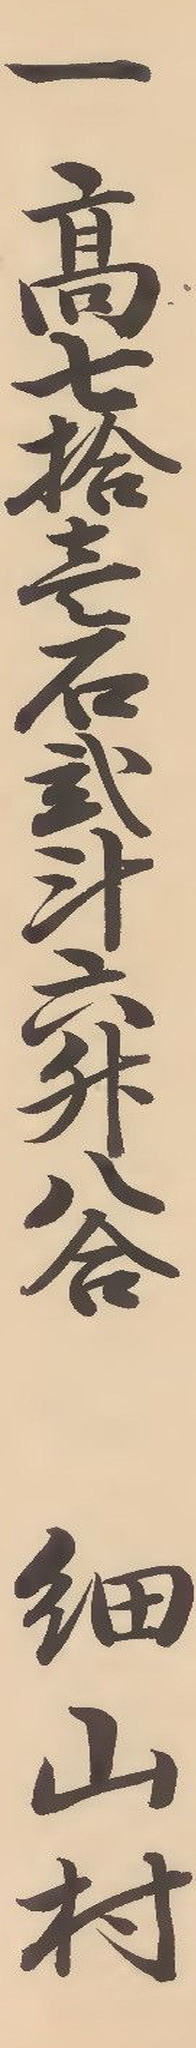一高七拾壱石弐斗六升八合細山村
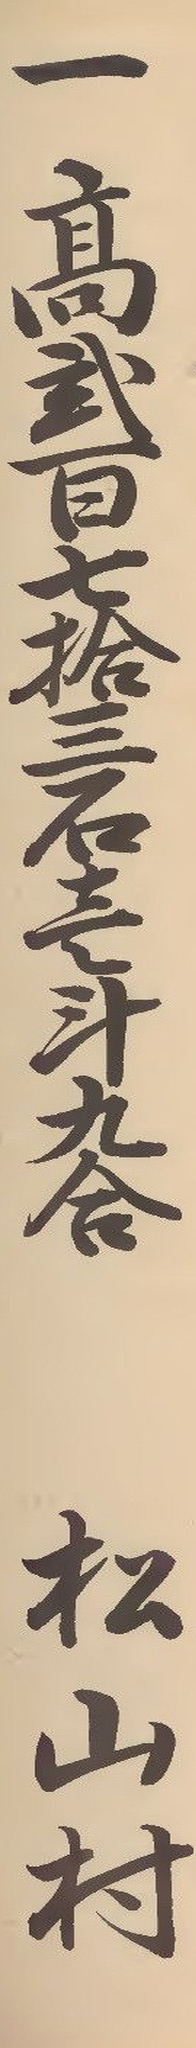一高弐百七拾三石壱斗九合松山村
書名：越後国郷帳　下
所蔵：国立公文書館 National Archives of Japan
